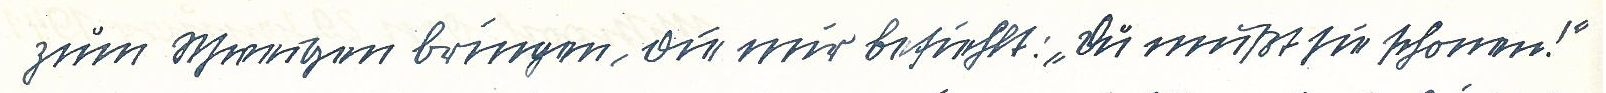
zum Schweigen bringen, die mir befiehlt: „Du mußt sie schonen!”
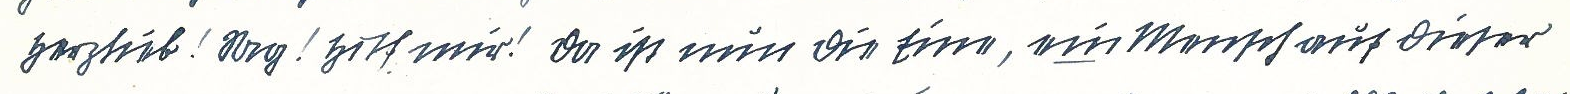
Herzlieb! Sag! Hilf mir! Da ist nun die Eine, ein Mensch auf dieser
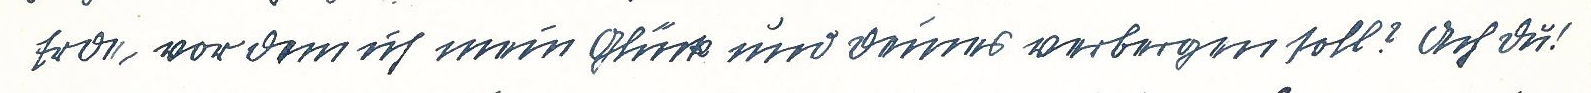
Erde, vor dem ich mein Glück und Deines verbergen soll? Ach Du!
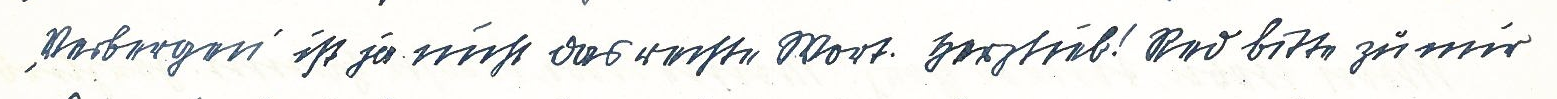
‚Verbergen’ ist ja nicht das rechte Wort. Herzlieb! Red bitte zu mir
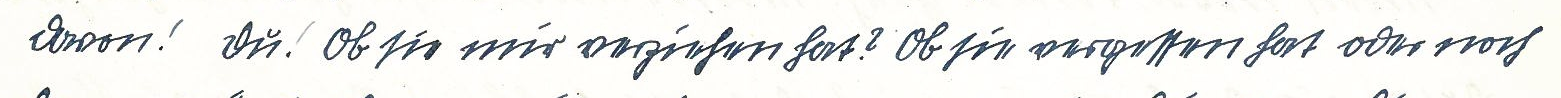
davon! Du! Ob sie mir verziehen hat? Ob sie vergessen hat oder noch
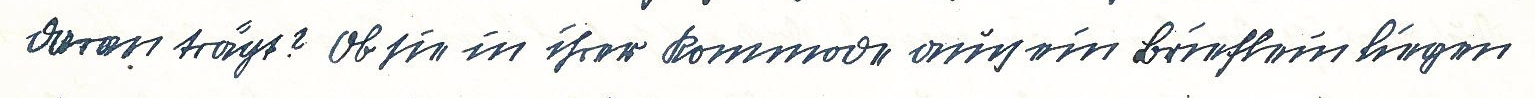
daran trägt? Ob sie in ihrer Kommode auch ein Brieflein liegen
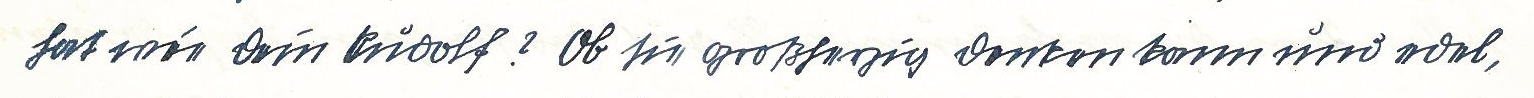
hat wie Dein ? Ob sie großherzig denken kann und edel,
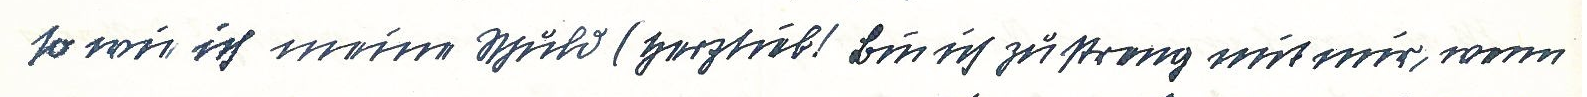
so wie ich meine Schuld (Herzlieb! Bin ich zu streng mit mir, wenn
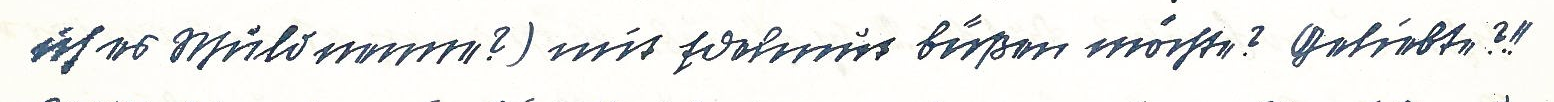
ich es Schuld nenne?) mit Edelmut büßen möchte? Geliebte?!!
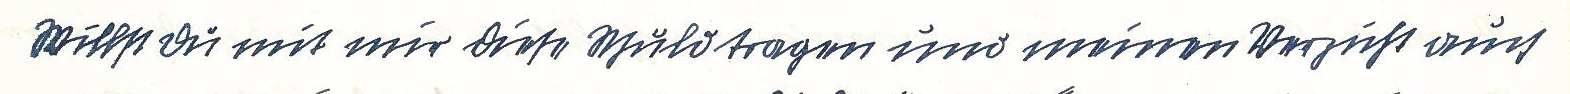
Willst Du mit mir diese Schuld tragen und meinen Verzicht auch
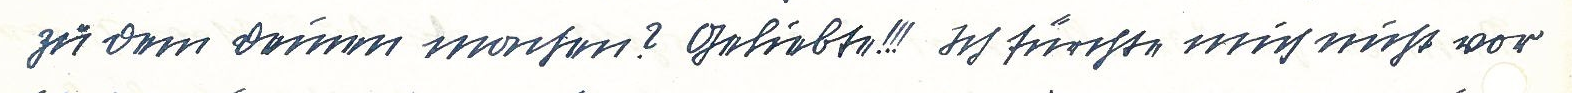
zu dem Deinen machen? Geliebte!!! Ich fürchte mich nicht vor
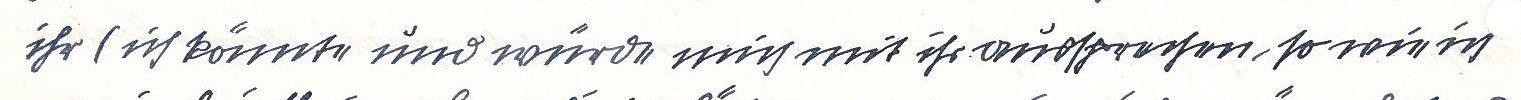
ihr (ich könnte und würde mich mit ihr aussprechen, so wie ich
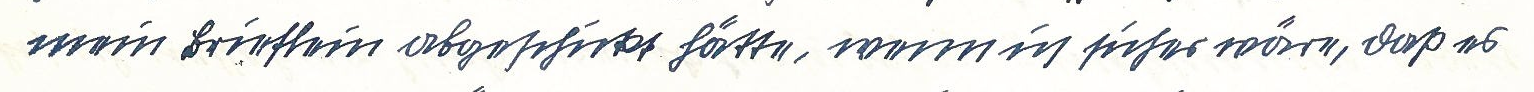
mein Brieflein abgeschickt hätte, wenn ich sicher wäre, daß es
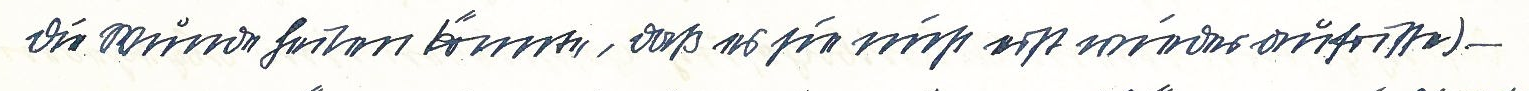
die Wunde heilen könnte, daß es sie nicht erst wieder aufrisse) –
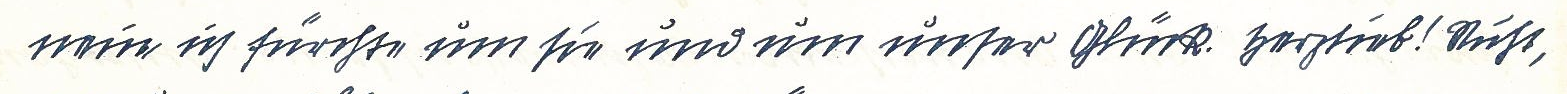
nein, ich fürchte um sie und um unser Glück. Herzlieb! Nicht,
